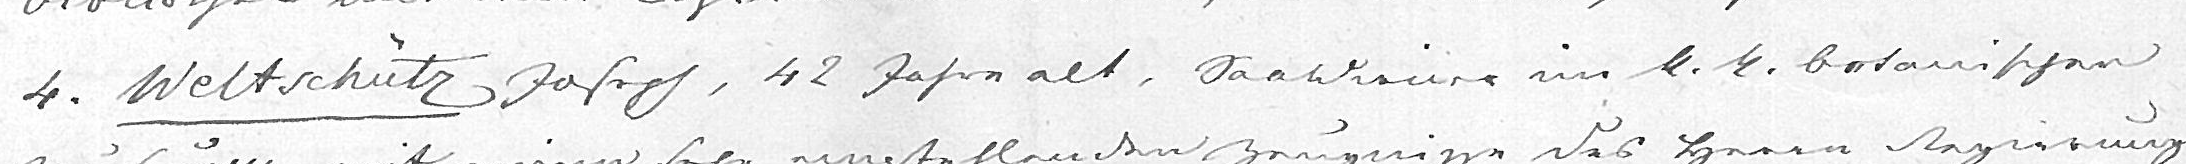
4. Weltschütz Joseph, 42 Jahre alt, Saaldiener im k.k. botanischen
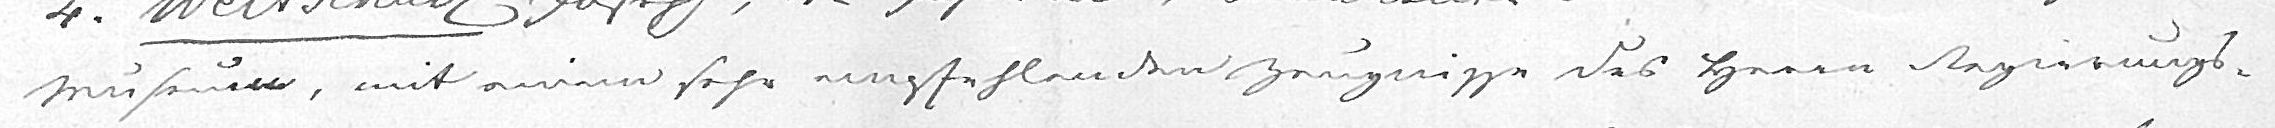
Museum, mit einem sehr empfehlenden Zeugnisse des Herrn Regiments-
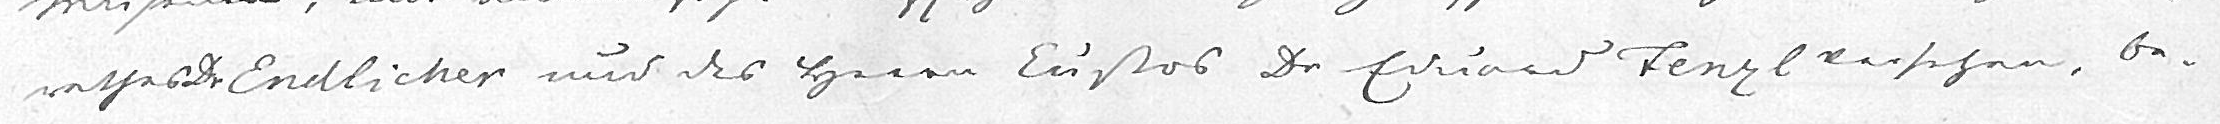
rathes Dr. Endlicher und des Herrn Custos Dr. Eduard Fenzl versehene, be-
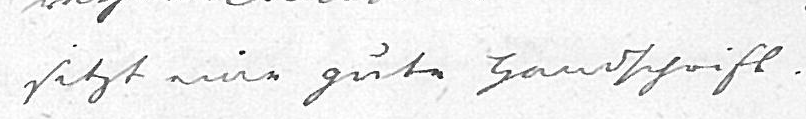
sitzt eine gute Handschrift.
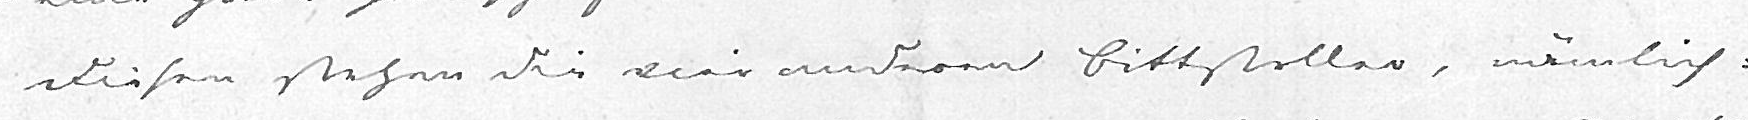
Disen stehen die vier anderen Bittsteller, nämlich:
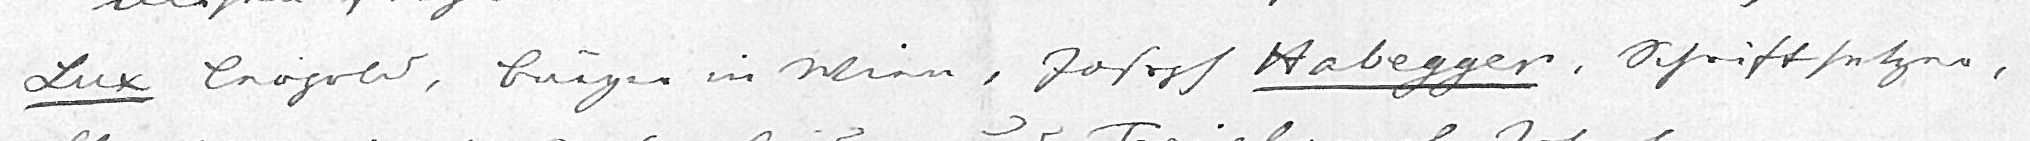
Lux Leopold, Bürger in Wien, Joseph Habegger, Schriftsetzer,
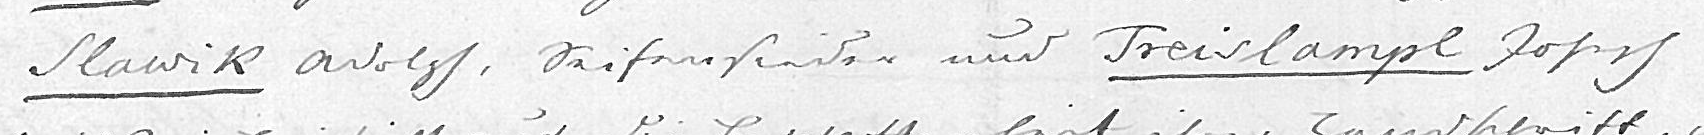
Slawik Adolph, Seifensieder und Treislampl Joseph
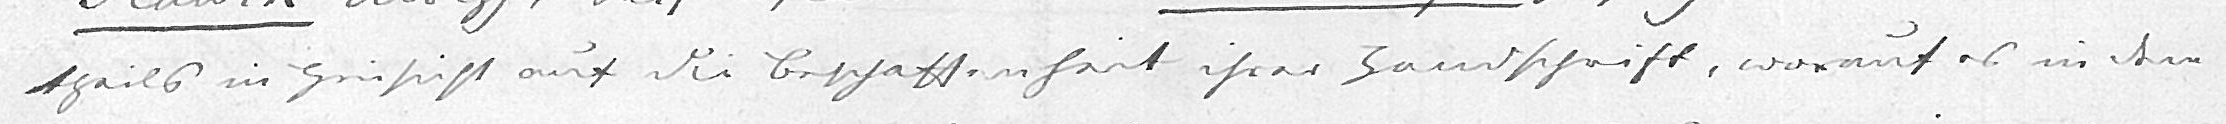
theils in Hinsicht auf die Beschaffenheit ihrer Handschrift, woraus es in dem
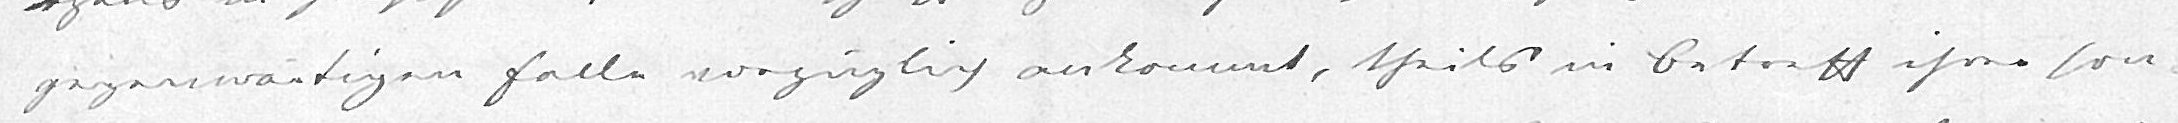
gegenwärtigen Fall vorzüglich ankommt, theils in Betreff ihrer son-
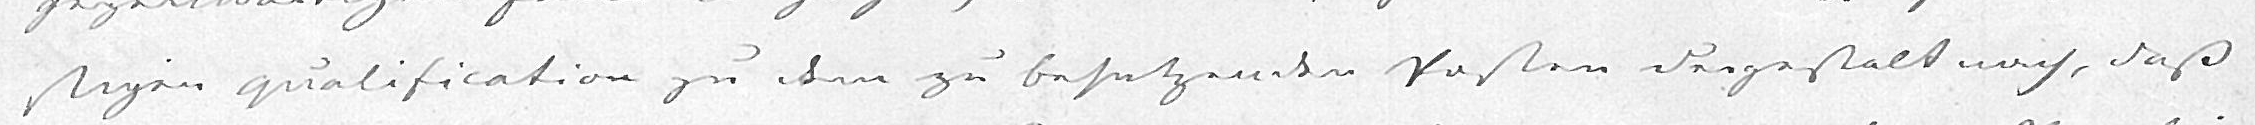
stigen Qualification zu dem zu besetzenden Posten dergestellt nach, daß
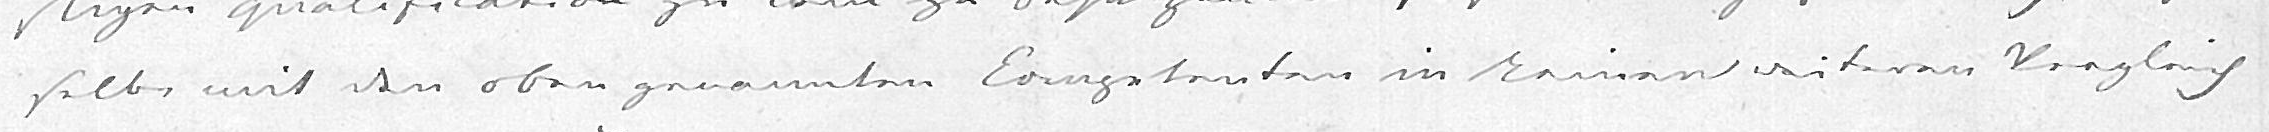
selbe mit den oben genannten Competanten in keinem weiteren Vergleich
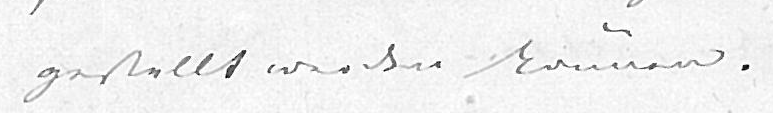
gestellt werden können.
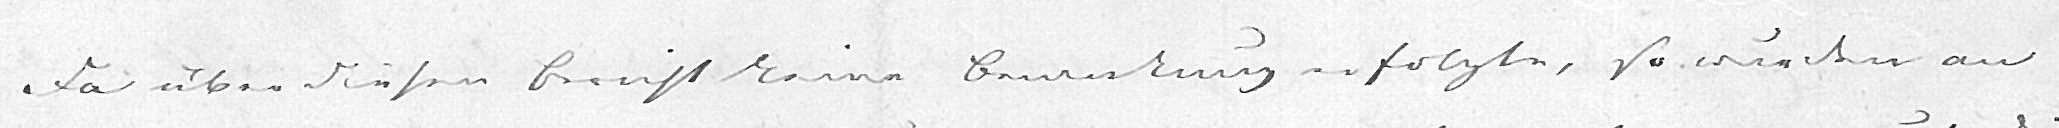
Da über diesen Bericht keine Bemerkung erfolgte, so wurden an
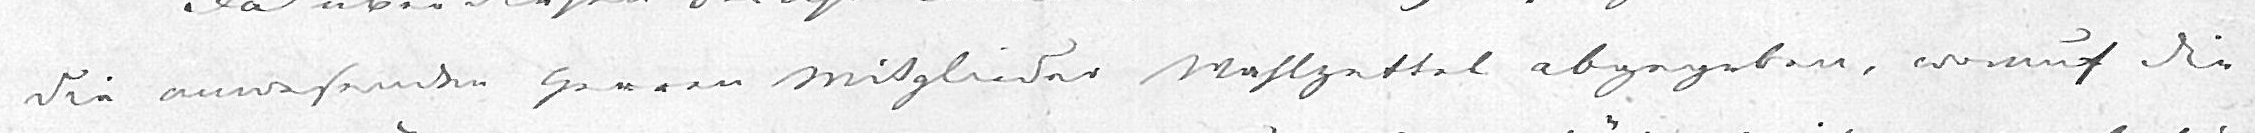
die anwesenden Herrn Mitglieder Wahlzettel abgegeben, worauf die
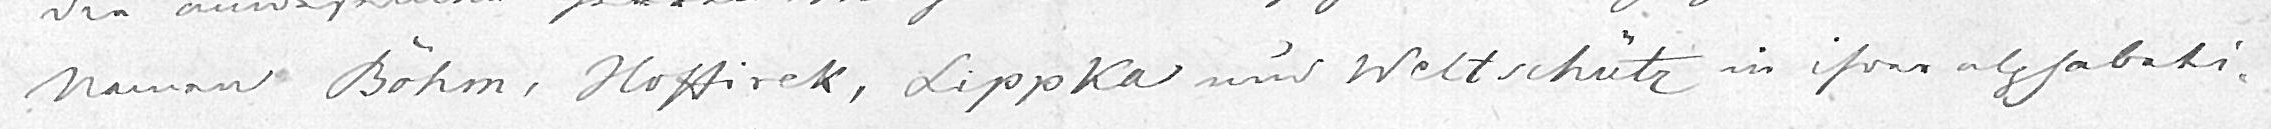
Namen Böhm, Hoffirek, Lippka und Weltschütz in ihrer alphabeti-
